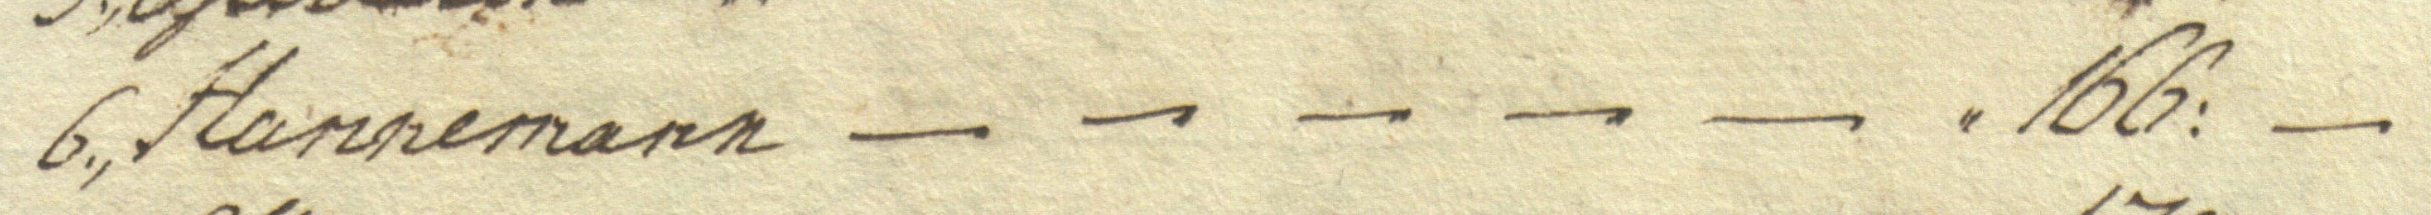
6., Hannemann 166:
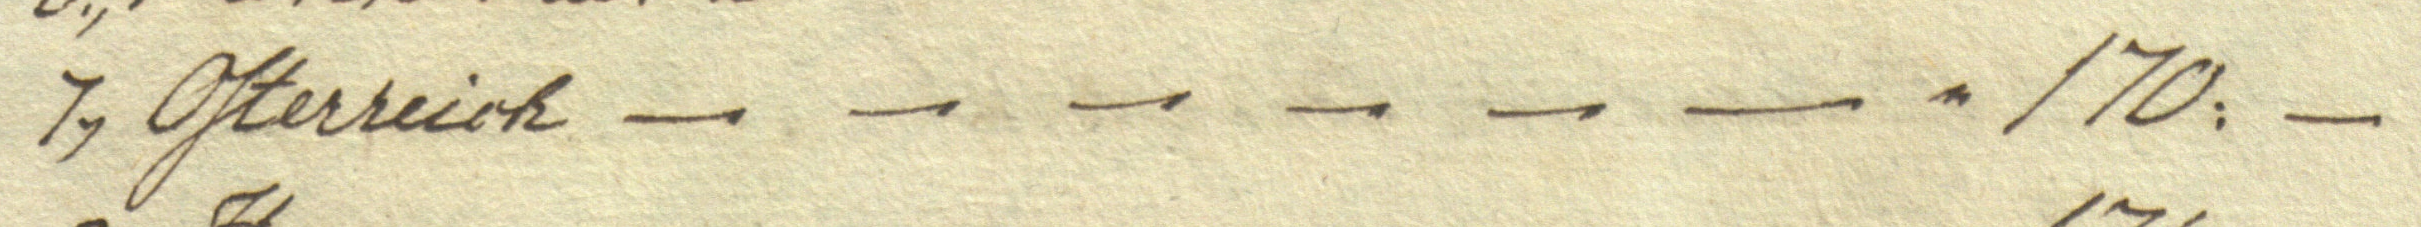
7., Osterreich 170:
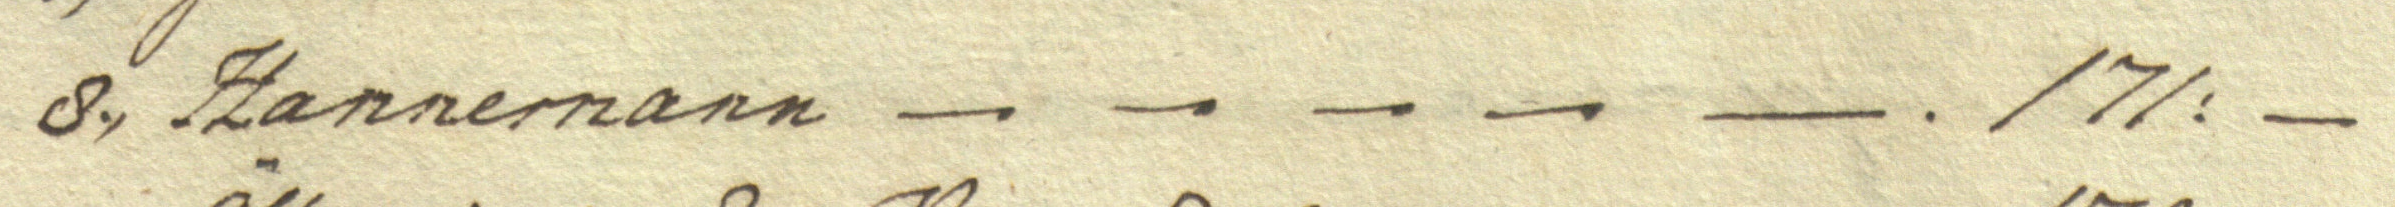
8., Hannemann 171:
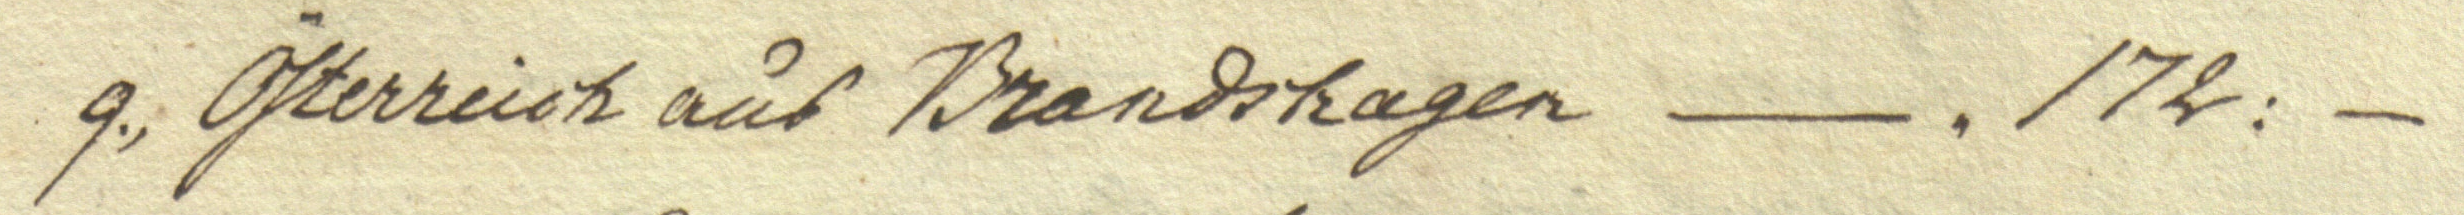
9., Österreich aus Brandshagen 172:
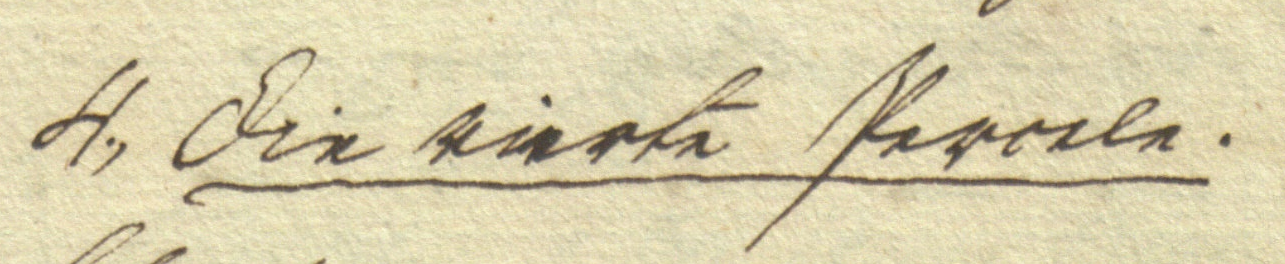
4. die vierte Percele.
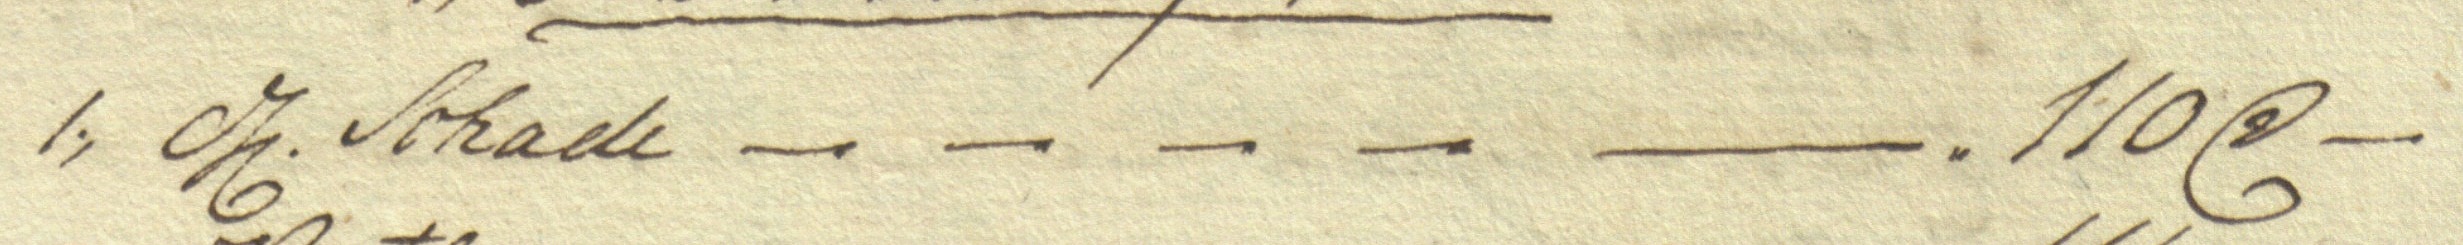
1., dh. Schade 110 l.
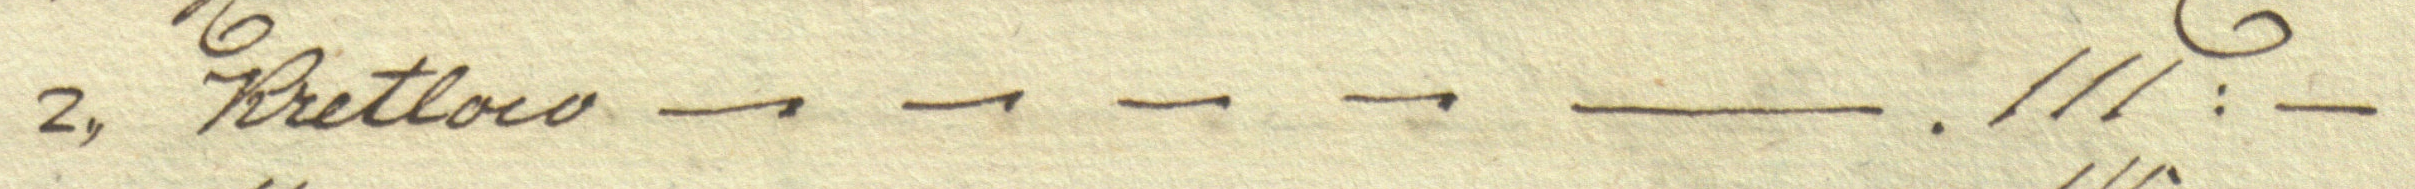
2., Kretlow 111:
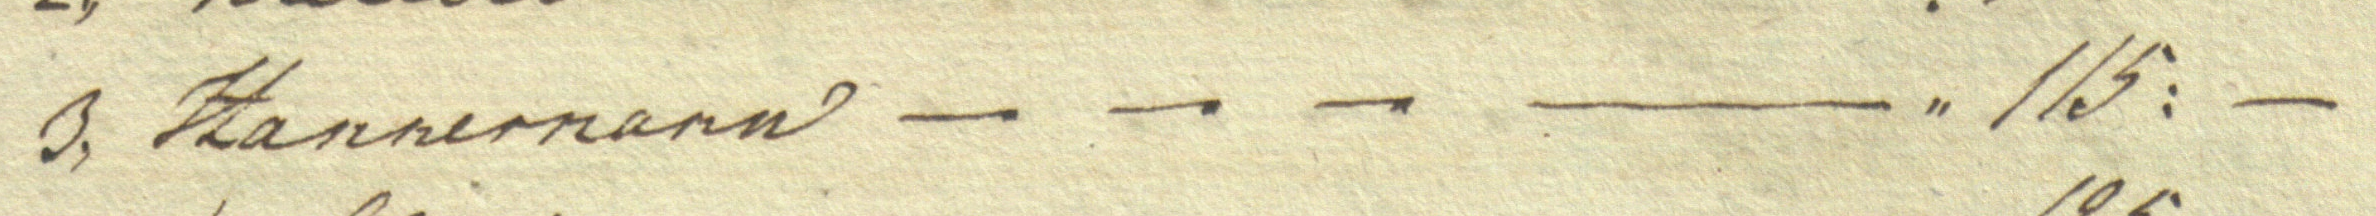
3., Hannemann 115:
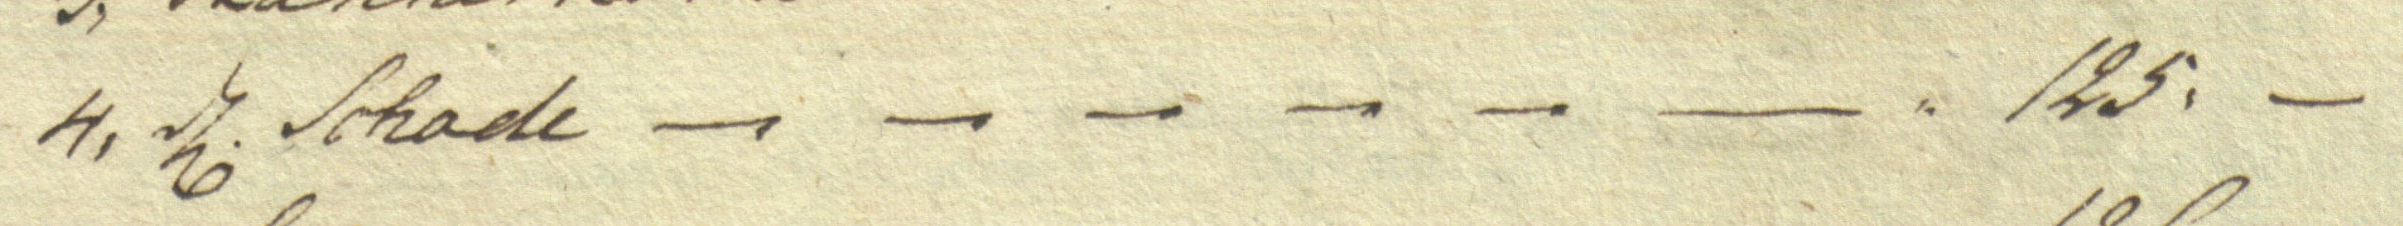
4, dh. Schade 125:
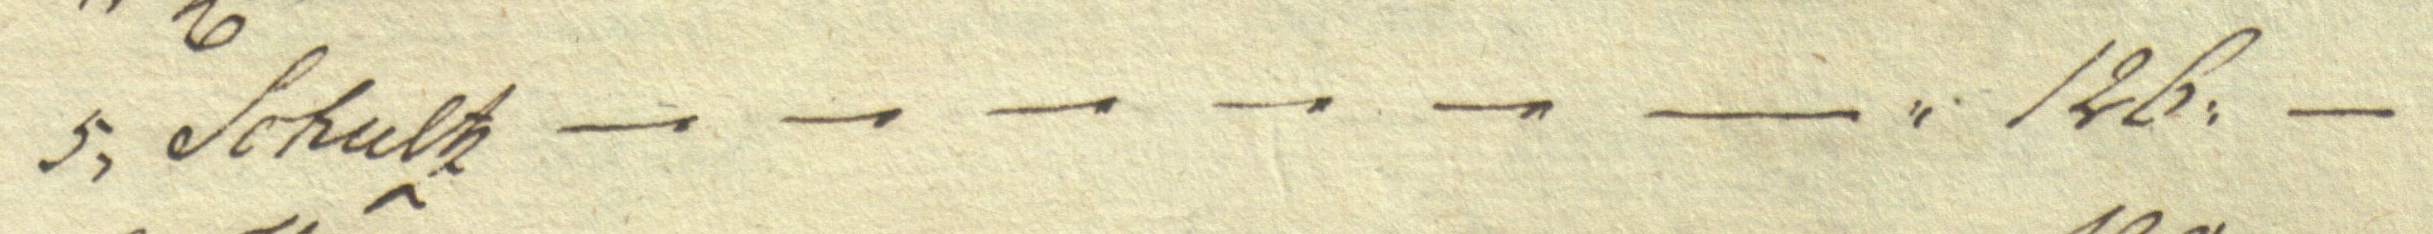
5., Schultz 126:
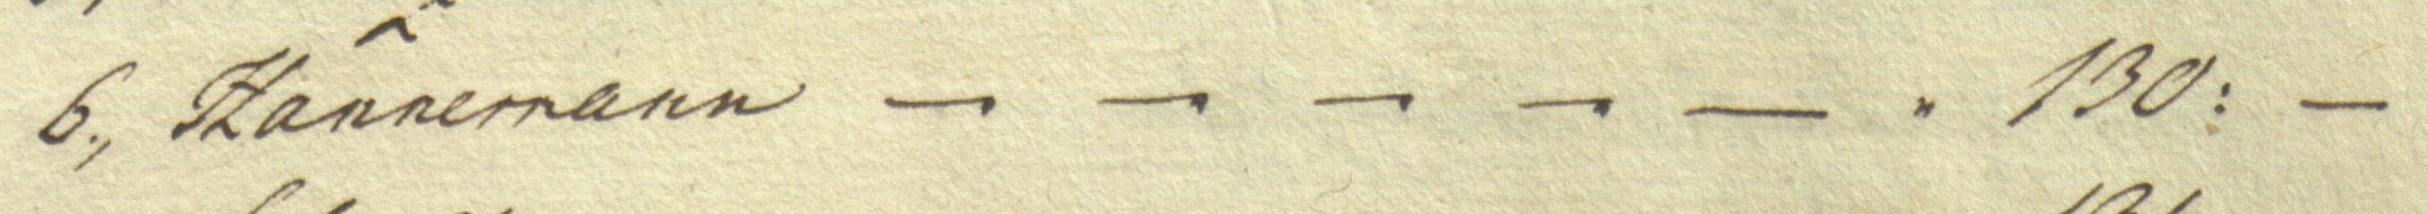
6., Hannemann 130:
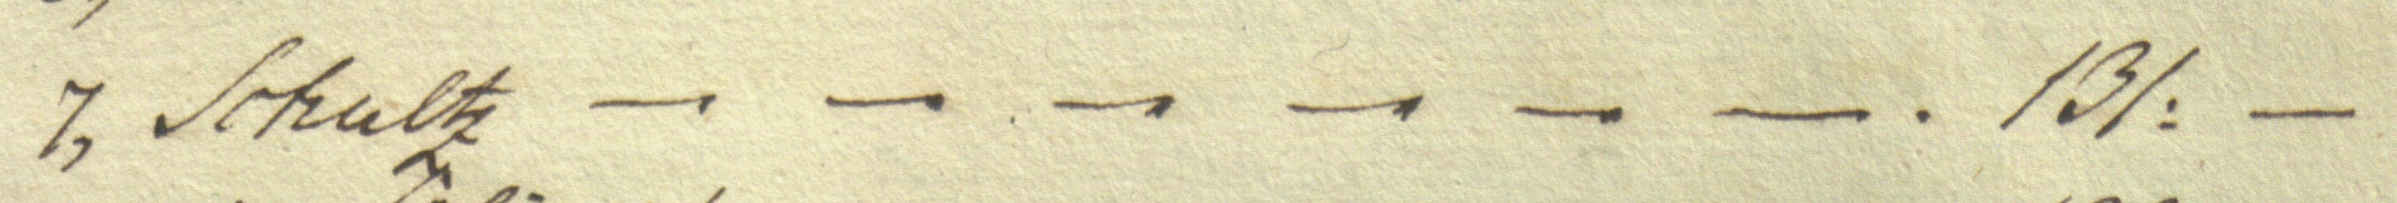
7., Schultz 131:
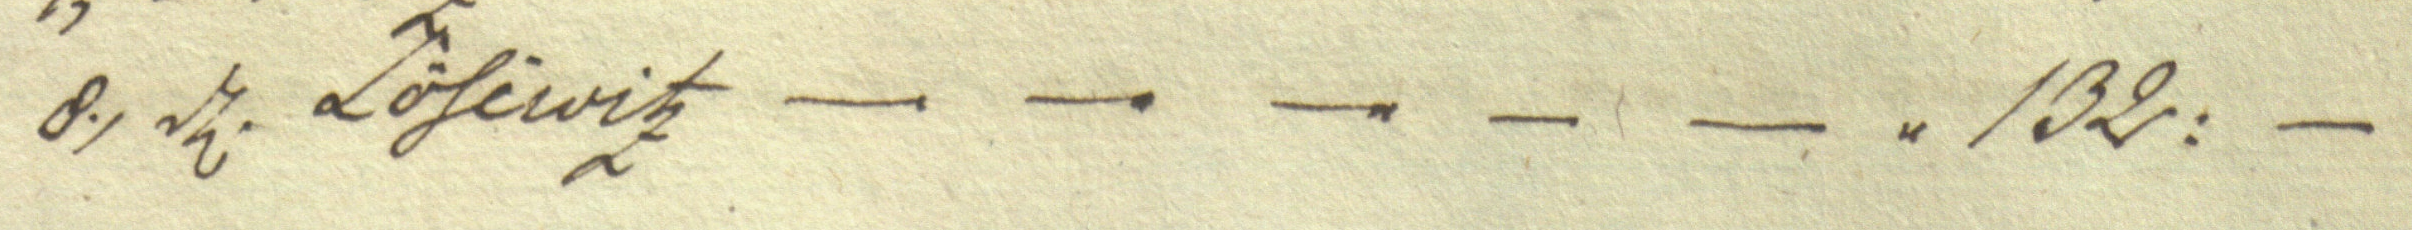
8, dh. Lösewitz 132:
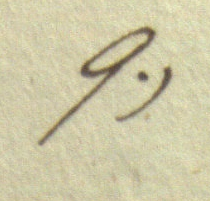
9.,
